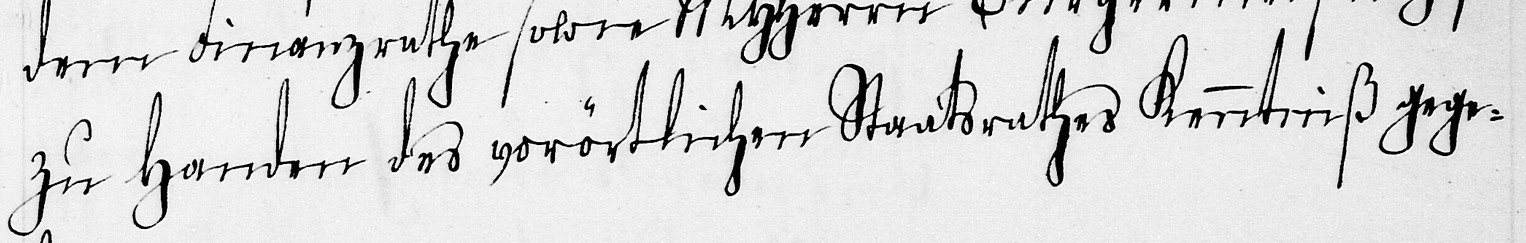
zu Handen des vorörtlichen Staatsrathes Kenntniß gege¬
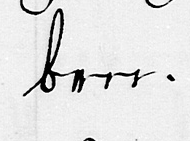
ben.
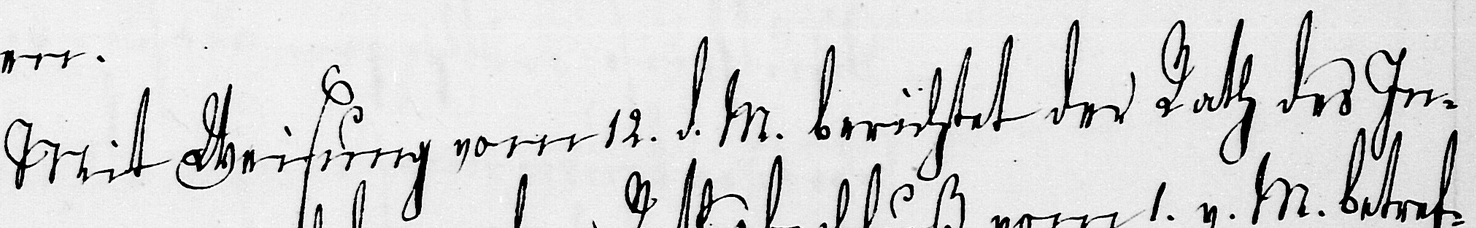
Mit Weisung vom 12. d. M. berichtet der Rath des In¬
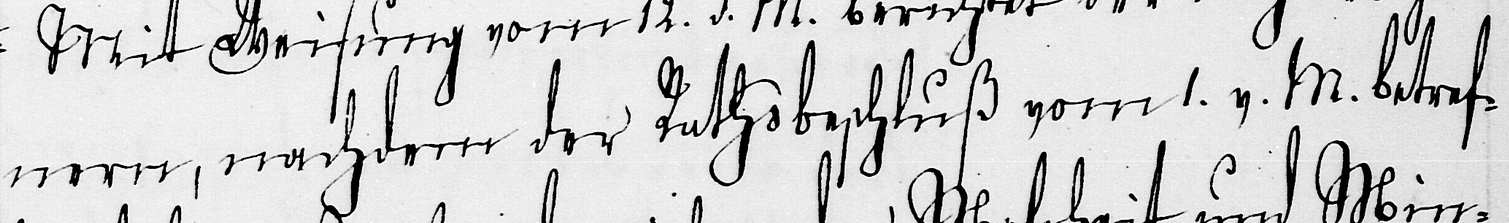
nern, nachdem der Rathsbeschluß vom 1. v. M. betref¬
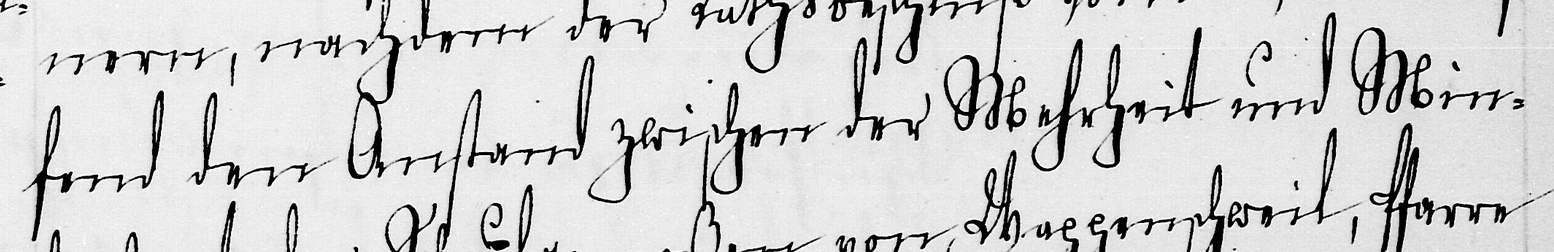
fend den Anstand zwischen der Mehrheit und Min¬
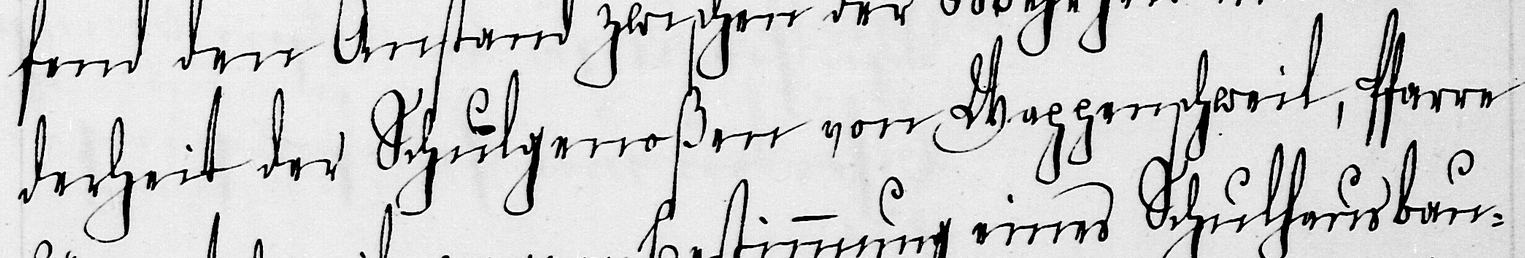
derheit der Schulgenoßen von Wappenschweil, Pfarre
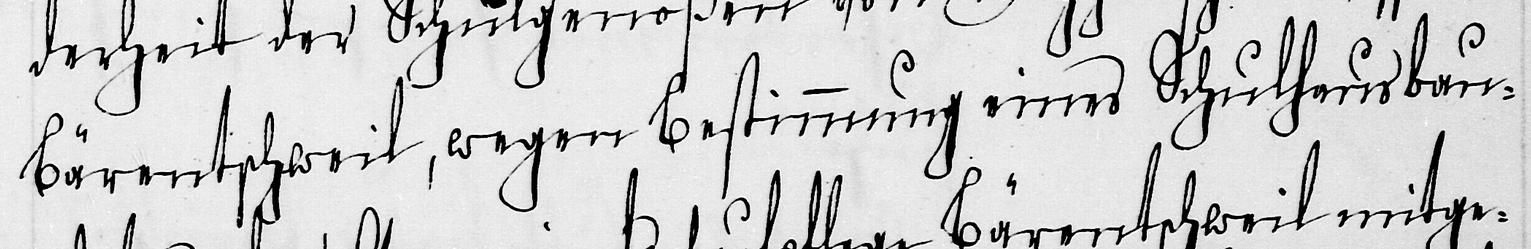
Bärentschweil, wegen Bestimmung eines Schulhausbau¬
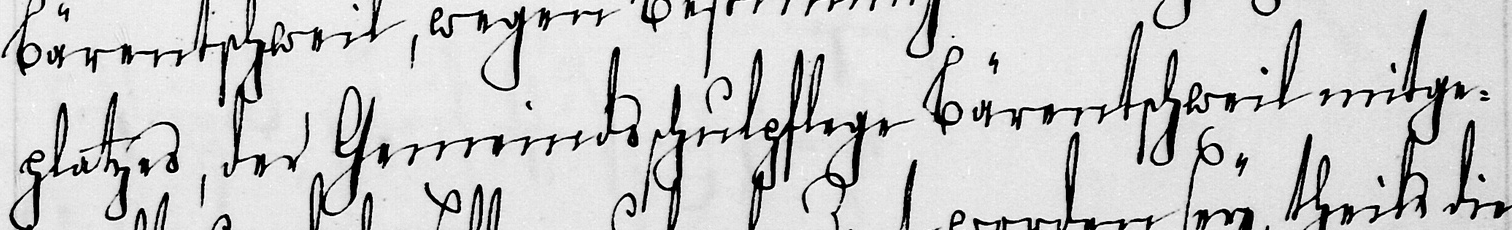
platzes, der Gemeindsschulpflege Bärentschweil mitge¬
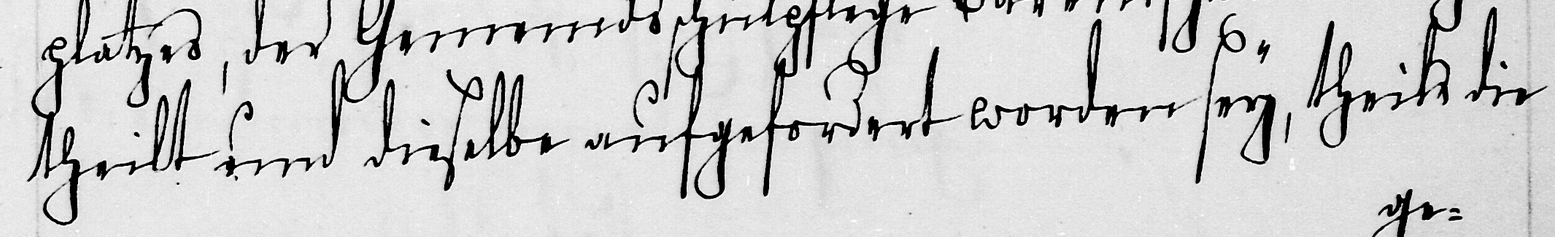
theilt und dieselbe aufgefordert worden sey, theils die
